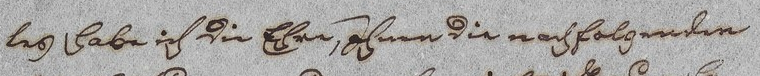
les habe ich die Ehre, Ihnen die nachfolgenden
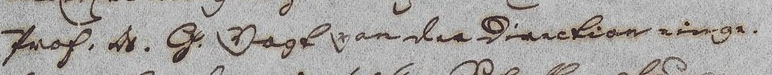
Prof. Dr. G. Vogt von der Direction einge-
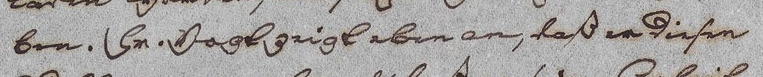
ben. Hr. Vogt zeigt eben an, daß er diesen
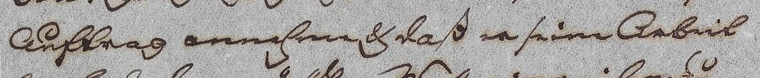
Auftrag annehmen & daß er seine Arbeit
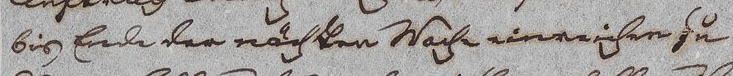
bis Ende der nächsten Woche einreichen zu
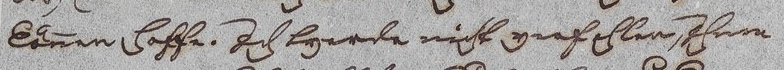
können hoffe. Ich werde nicht verfehlen, Ihnen
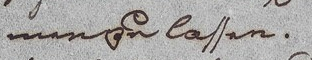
men zu lassen.
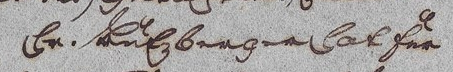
Hr. Bützberger hat für
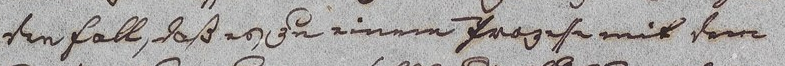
den Fall, daß es zu einem Prozesse mit dem
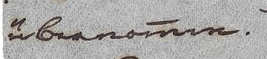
übernommen.
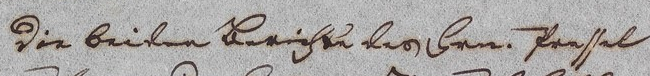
Die beiden Berichte des Hrn. Pressel
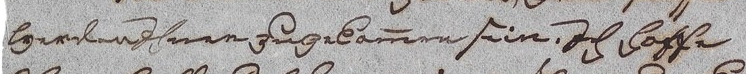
werden Ihnen zugekommen sein. Ich hoffe
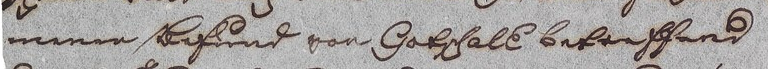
menen Befund von Gotschalk betreffend
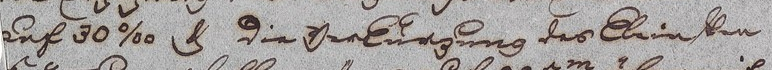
auf 30‰ & die Verkürzung des kleinsten
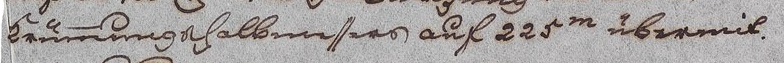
Krümmungshalbmessers auf 225m übermit-
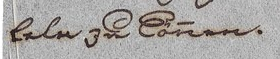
teln zu können.
